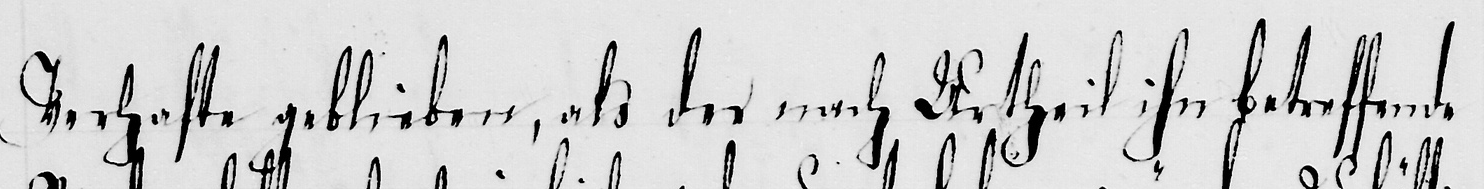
Verhafte geblieben, als der nach Urtheil ihn betreffen¬
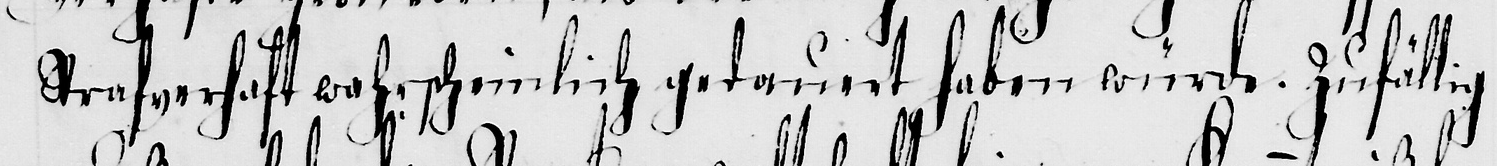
Strafverhaft wahrscheinlich gedauert haben würde. Zufällig
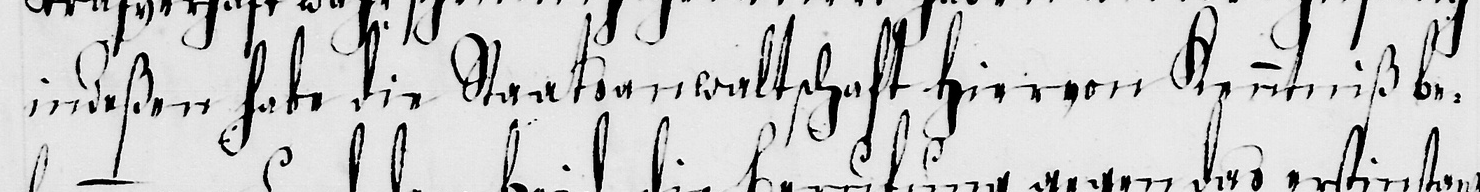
indeßen habe die Staatsanwaltschaft hiervon Kenntniß be¬
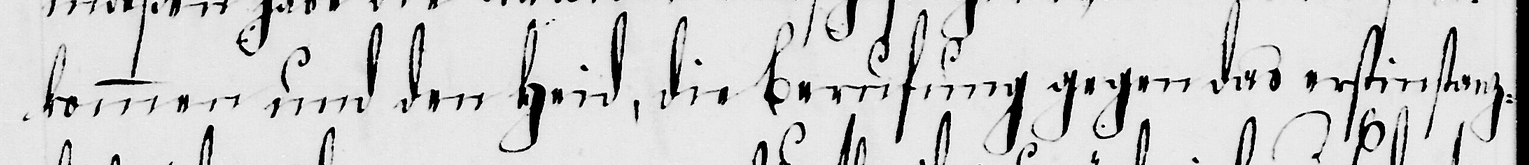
kommen und den Heid, die Berufung gegen das erstinstanz¬
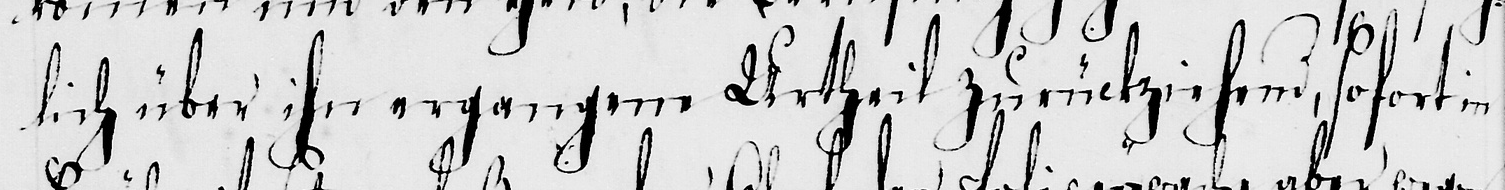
lich über ihn ergangene Urtheil zurückziehend, sofort
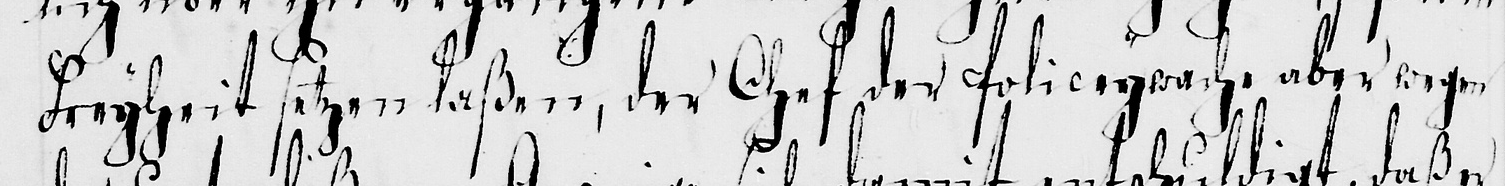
Freyheit setzen laßen, der Chef der Policeywache aber wegen
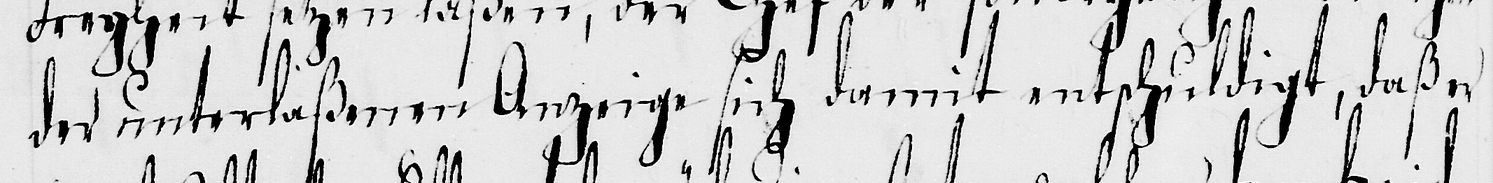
der unterlaßenen Anzeige sich damit entschuldigt, daß er
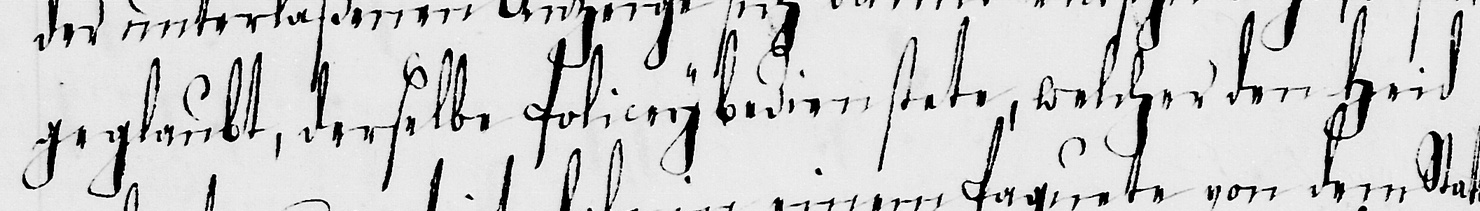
geglaubt, derselbe Policeybedienstete, welcher
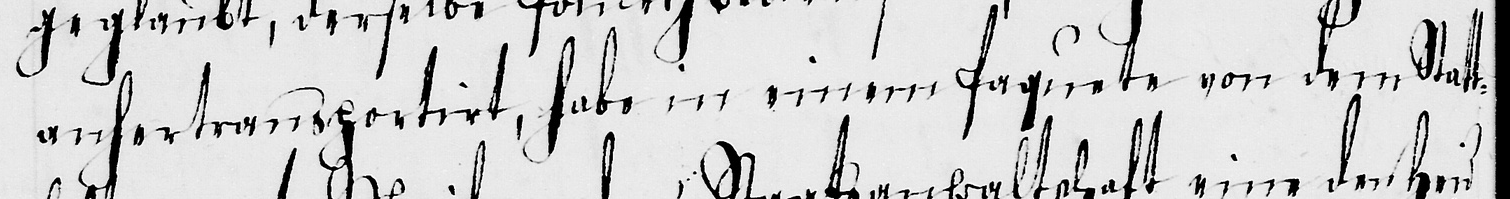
anhertransportirt, habe in einem Paquete von dem Stat¬
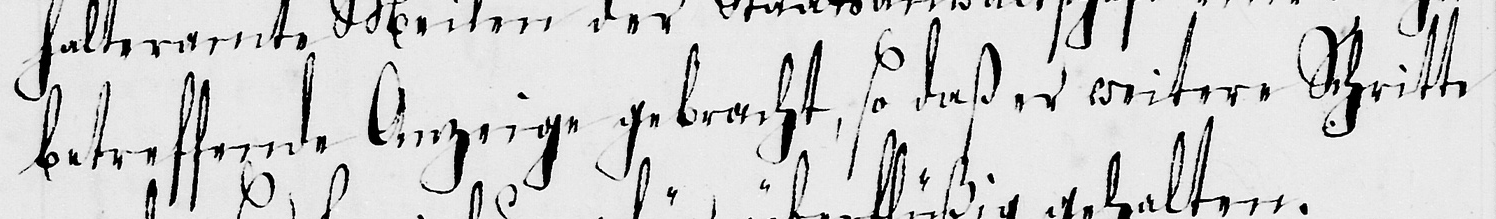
betreffende Anzeige gebracht, so daß er weitere Schritte
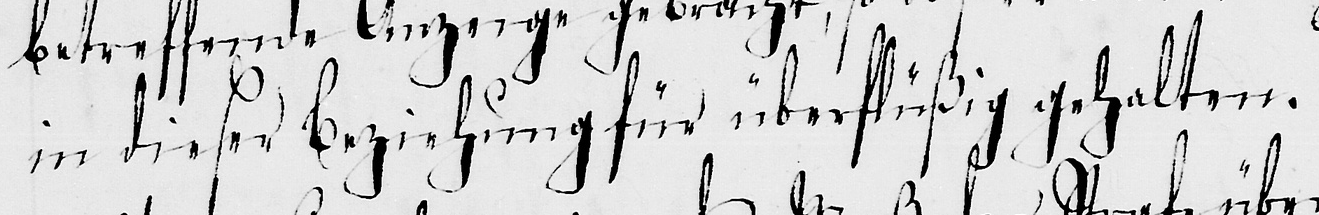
in dieser Beziehung für überflüßig gehalten.
